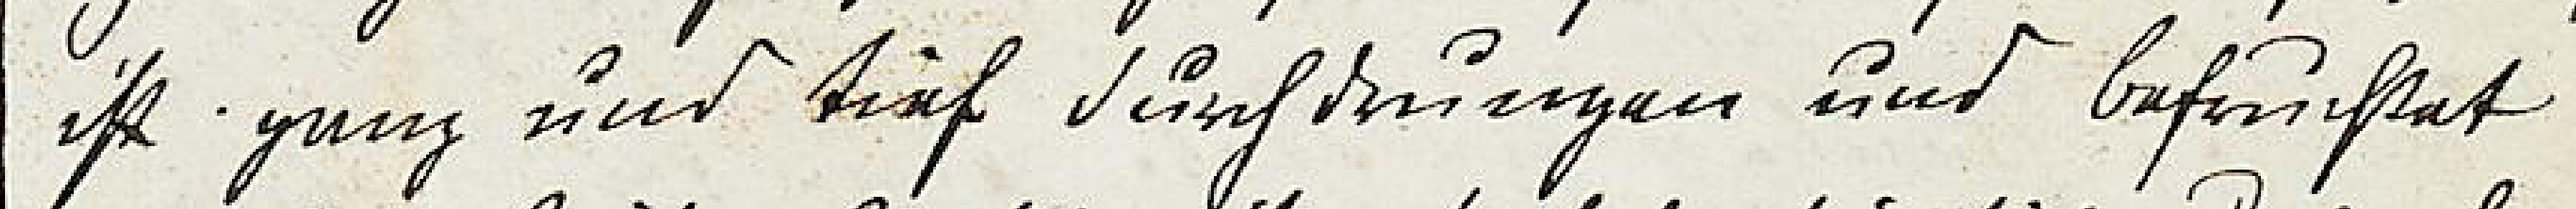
ist ganz und tief durchdrungen und befruchtet
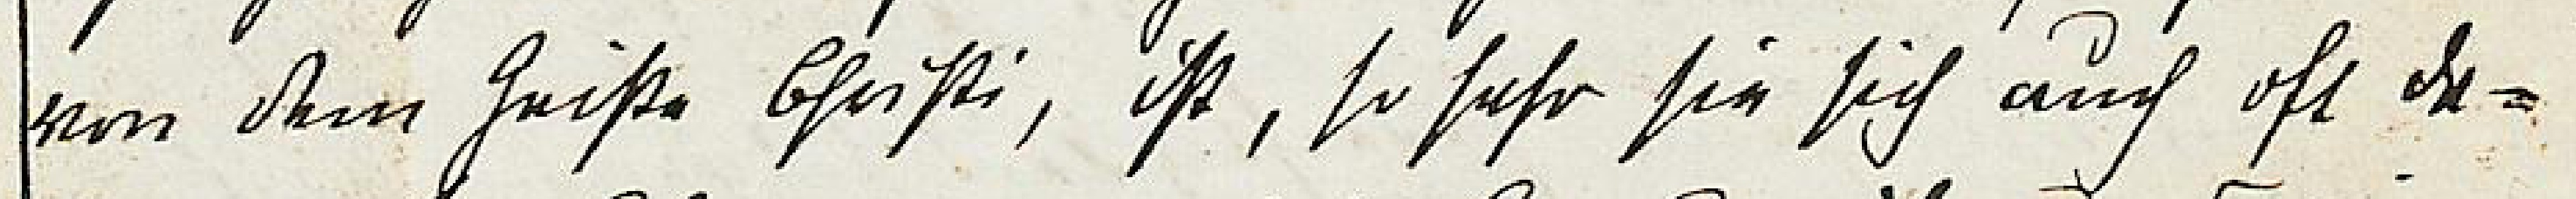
von dem Geiste Christi, ist, so sehr sie sich auch oft da¬
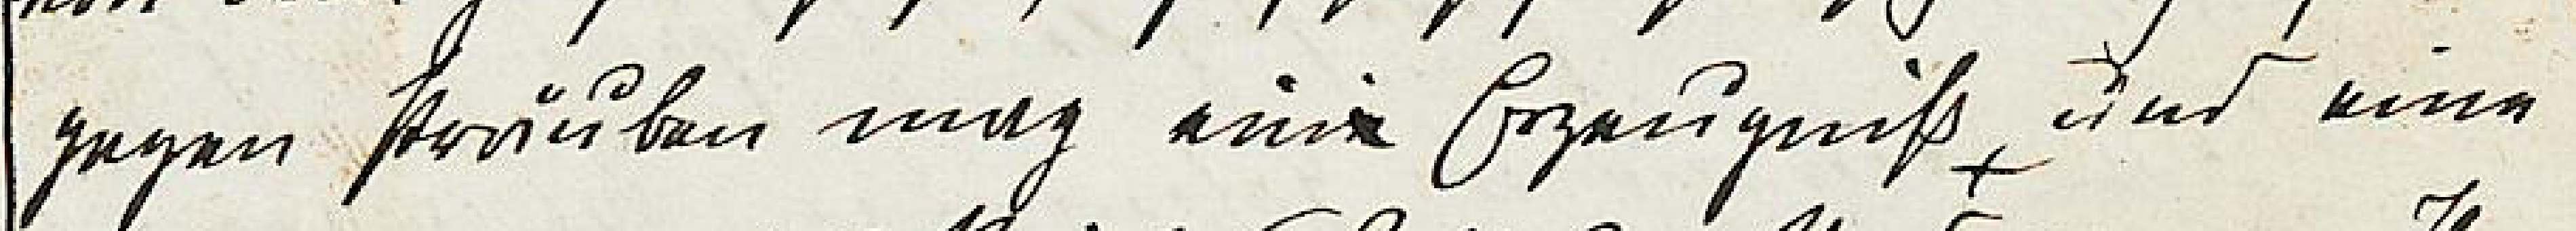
gegen stäuben mag eine Erzeugniß, und eine
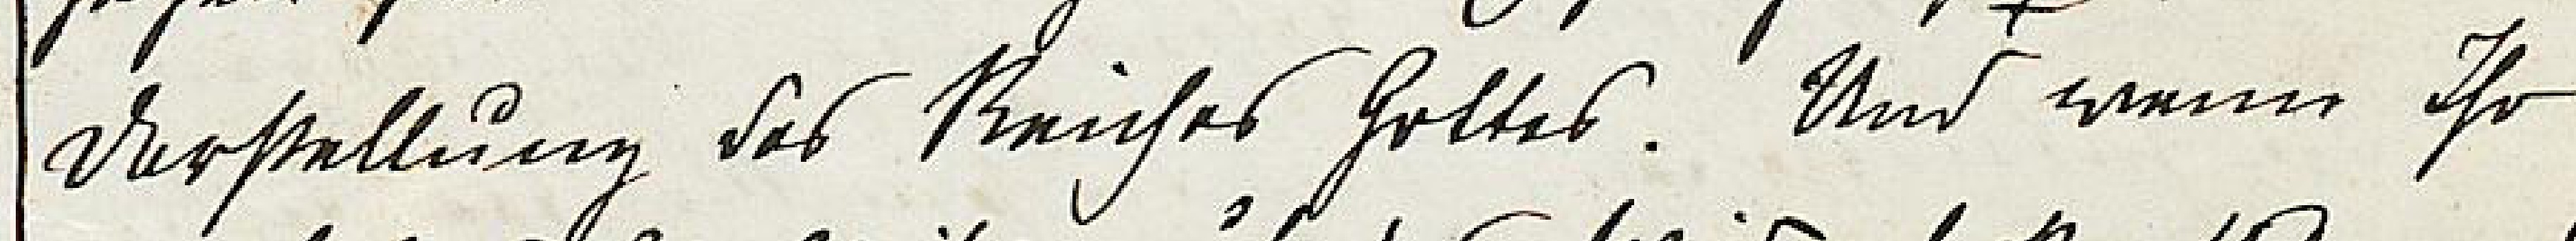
Darstellung des Reiches Gottes. Und wenn Ihr
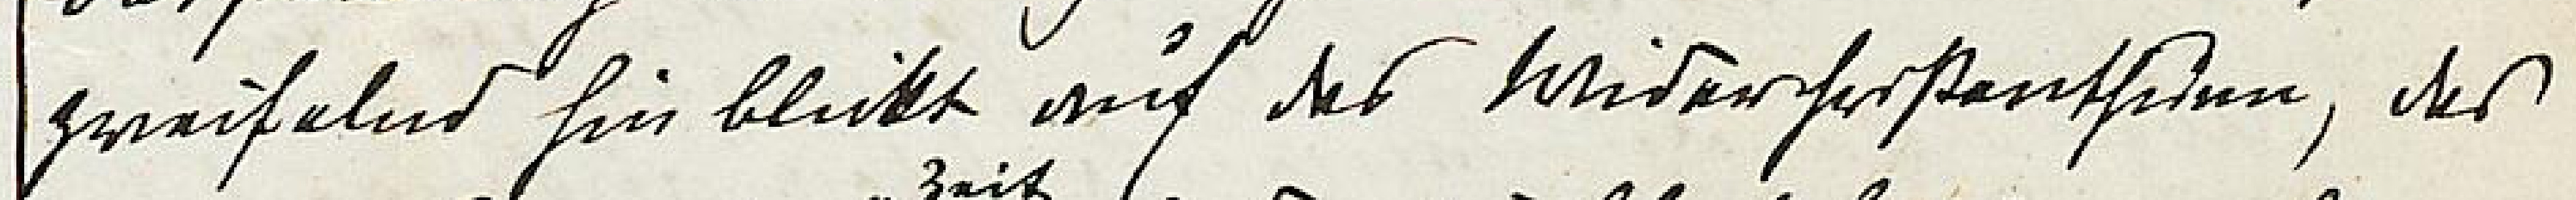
zweifelnd hinblickt auf das Widerchristenthum, das
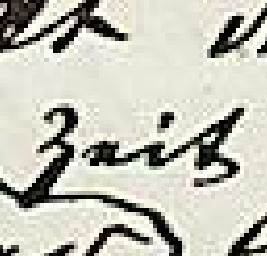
Zeit
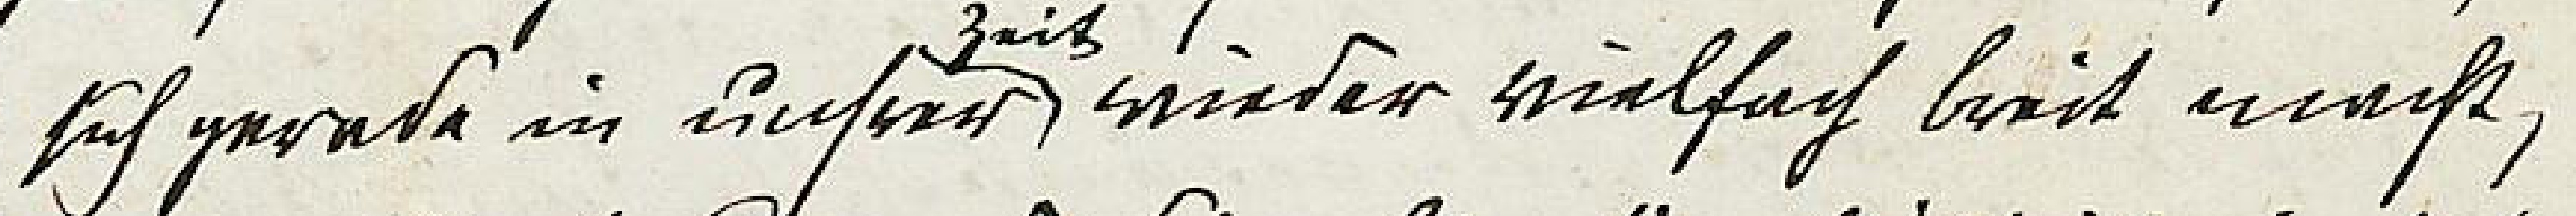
sich gerade in unserer wieder vielfach breit macht,
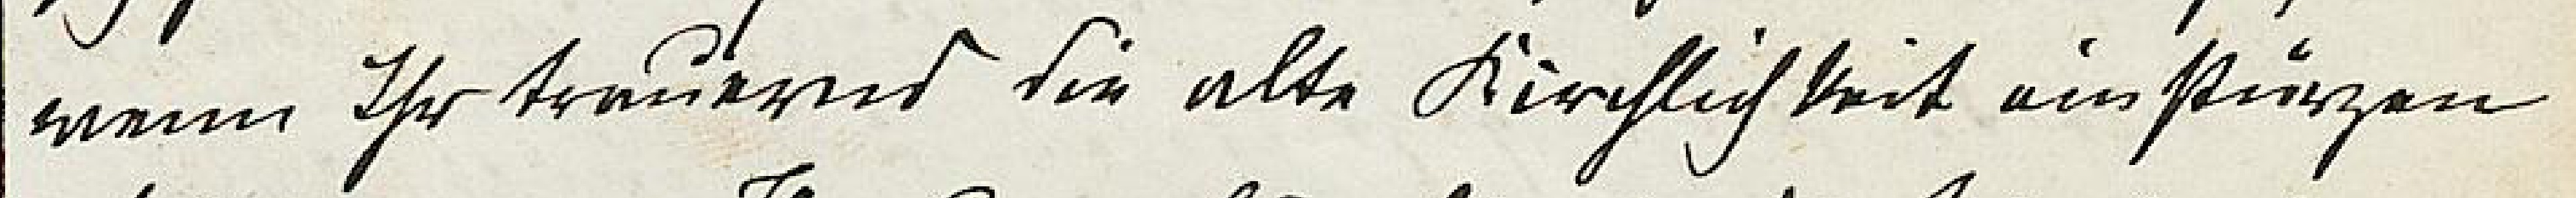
wenn Ihr trauernd die alte Kirchlichkeit einstürzen
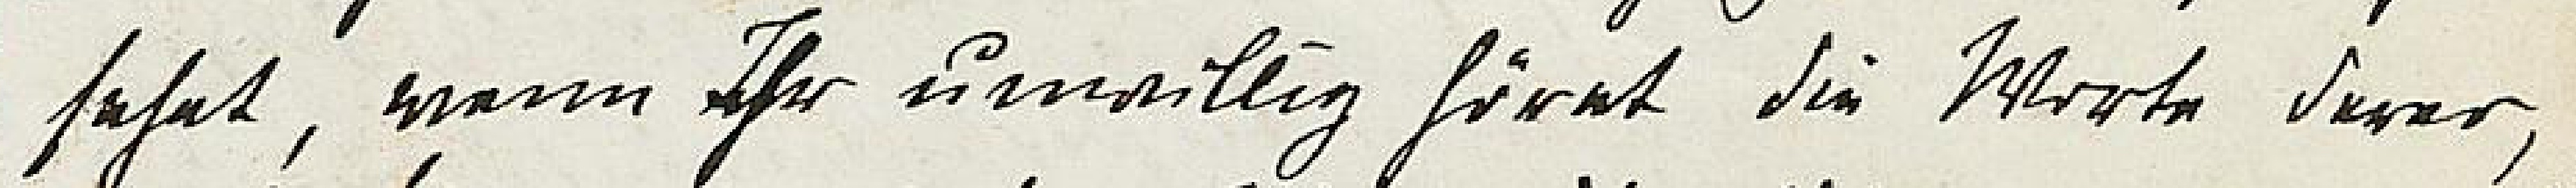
seht, wenn Ihr unwillig höret die Worte derer,
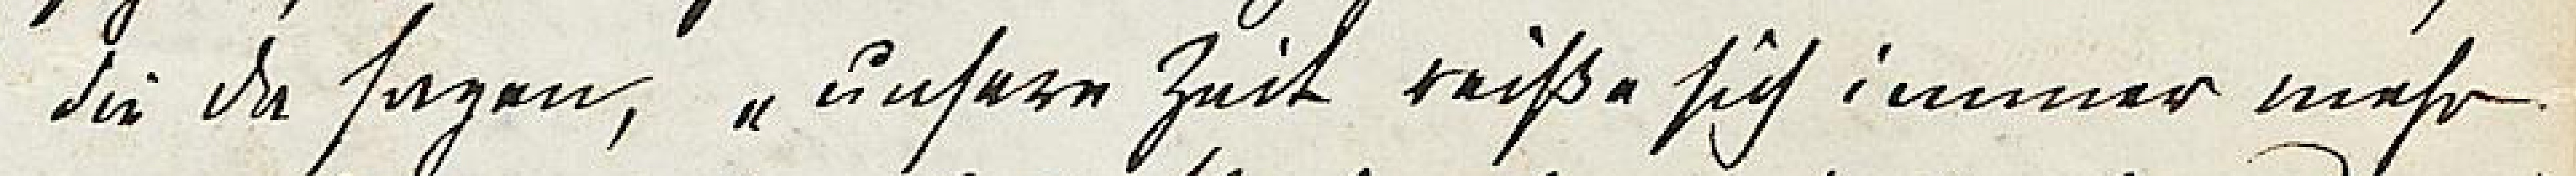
die da sagen, "unsere Zeit rieße sich immer mehr
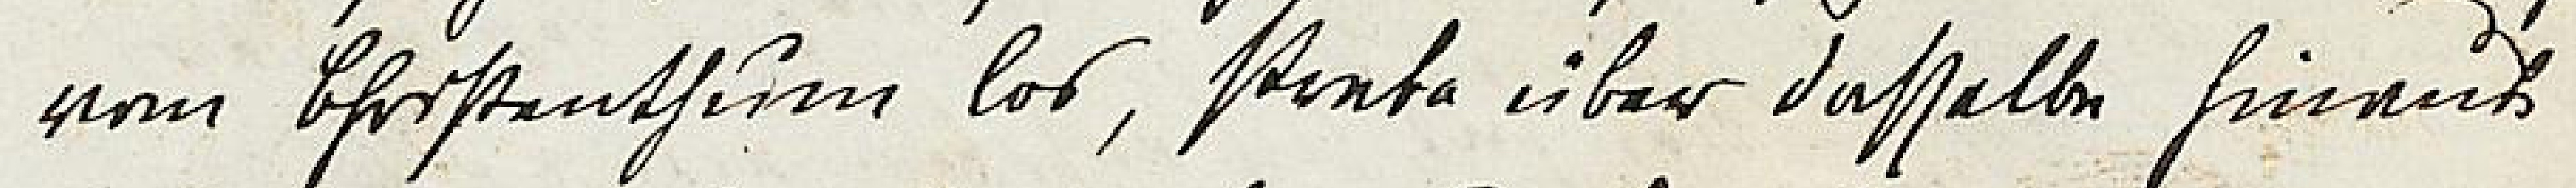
vom Christenthum los, strebe über dasselbe hinaus
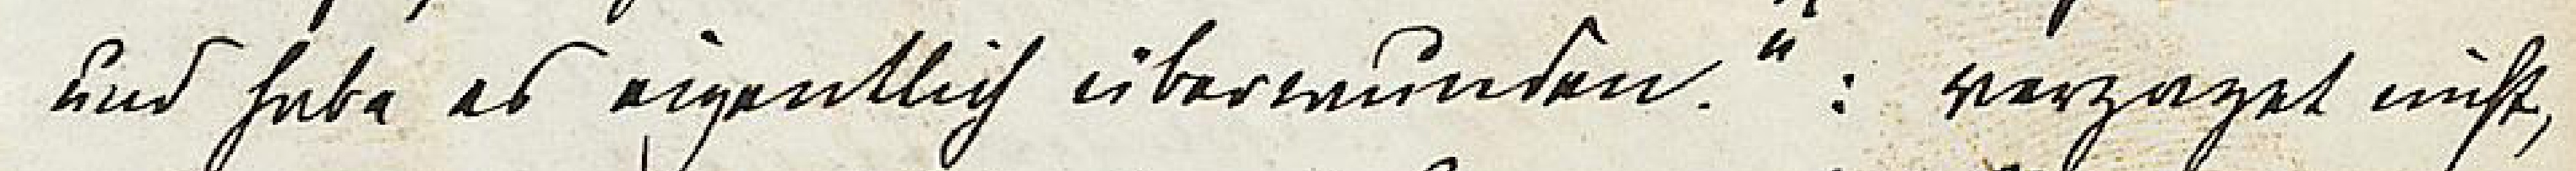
und habe es eigentlich überwunden.": verzaget nicht,
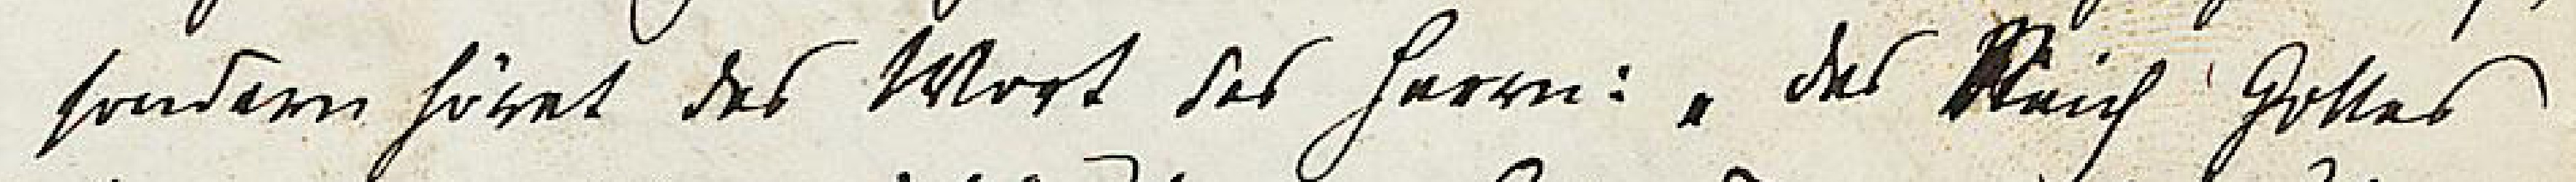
sondern höret das Wort des Herrn: "das REich Gottes
